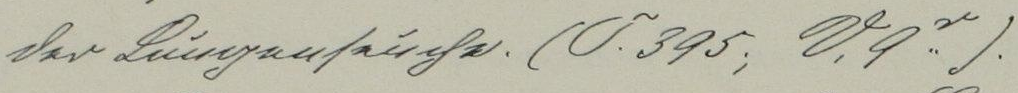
der Lungenseuche. (T.395; V.9r).
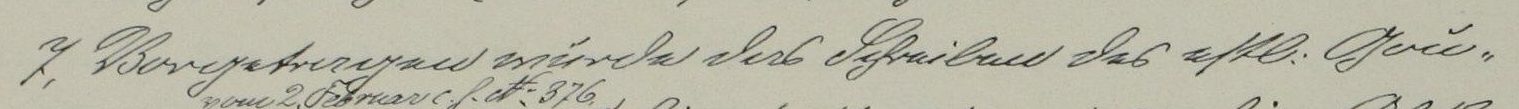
7. Vorgetragen wurde das Schreiben des estl. Gou-
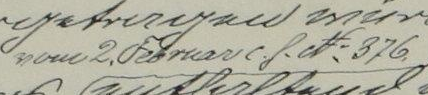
vom 2. Februar c. s. No.376
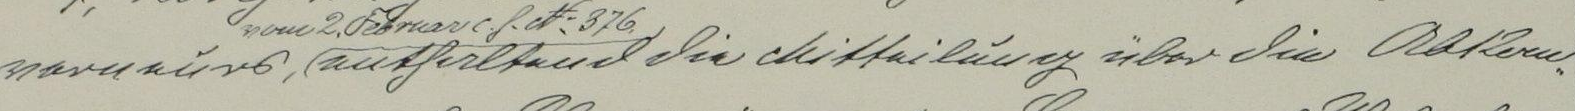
verneurs, enthaltend die Mitteilung über die Abkom-
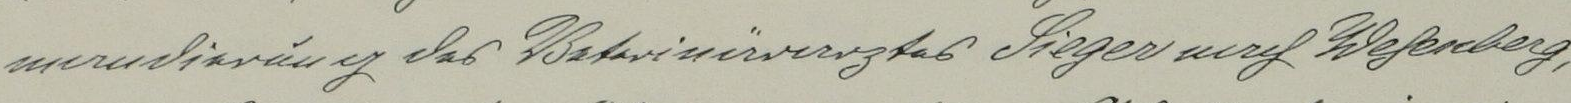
mandierung des Veterinärarztes Sieger nach Wesenberg,
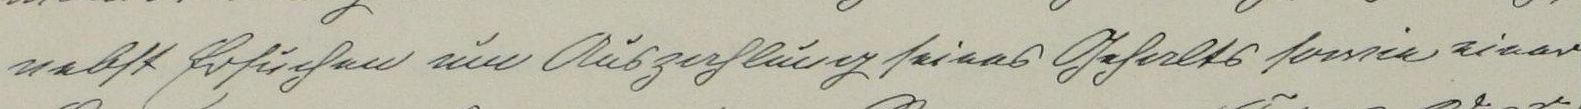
nebst Ersuchen um Auszahlung seines Gehalts sowie einer
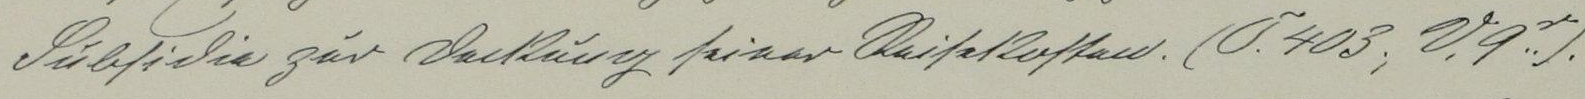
Subsidie zur Deckung seiner Reisekosten. (T.403; V.9r).
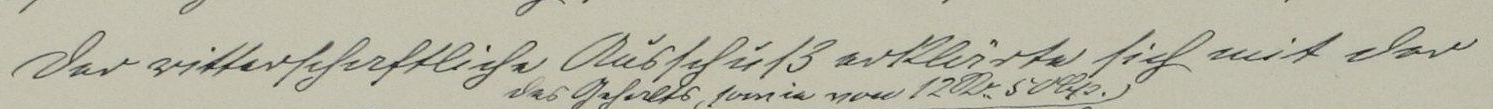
Der ritterschaftliche Ausschuß erklärte sich mit der
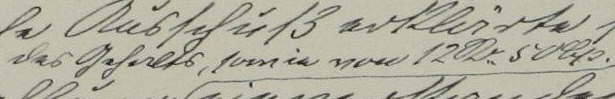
des Gehalts, sowie von 12 Ro. 50 Cop.
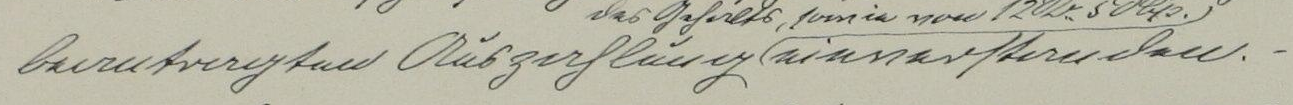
beantragten Auszahlung einverstanden.
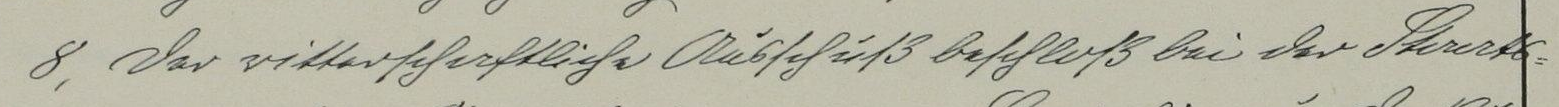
8. Der ritterschaftliche Ausschuß beschloß bei der Staats-
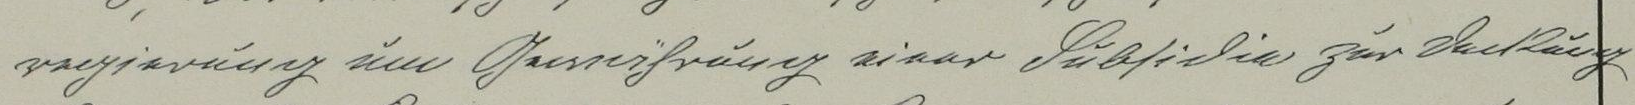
regierung um Gewährung einer Subsidie zur Deckung
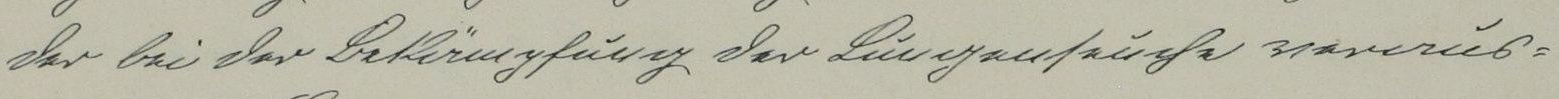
der bei der Bekämpfung der Lungenseuche veraus-
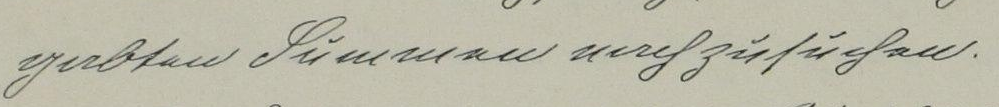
gabten Summen nachzusuchen.
